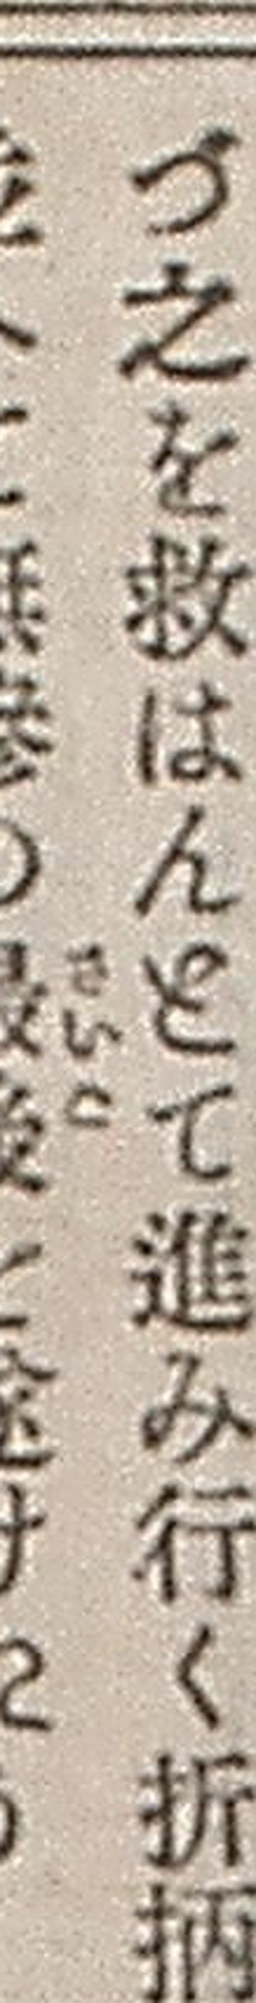並へて無惨の最後を遂けたり
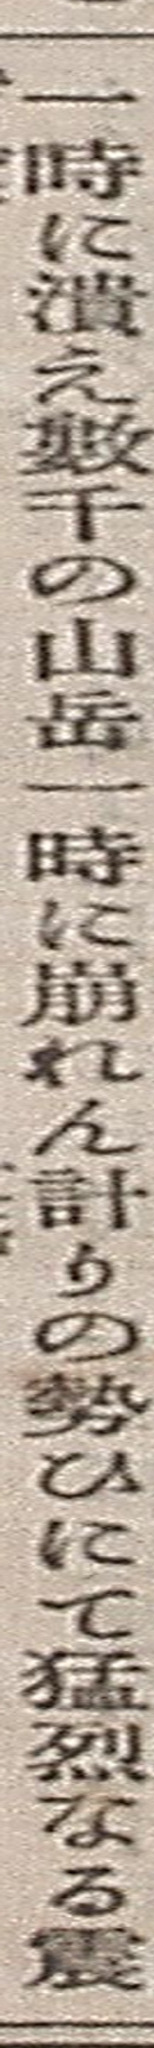一時に潰え数千の山岳一時に崩れん計りの勢ひにて猛烈なる震
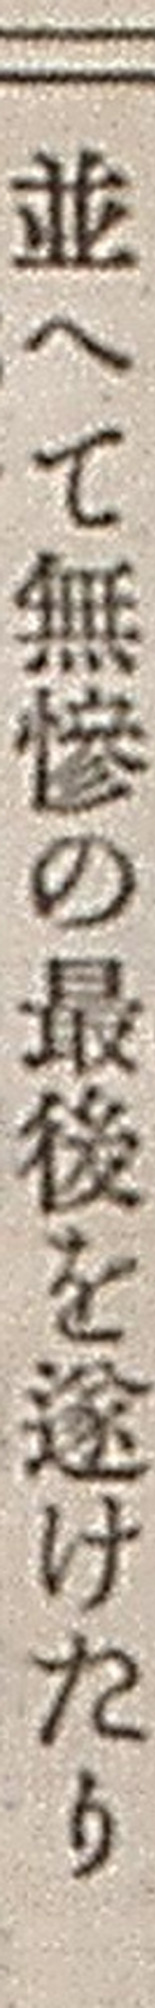並へて無惨の最後を遂けたり
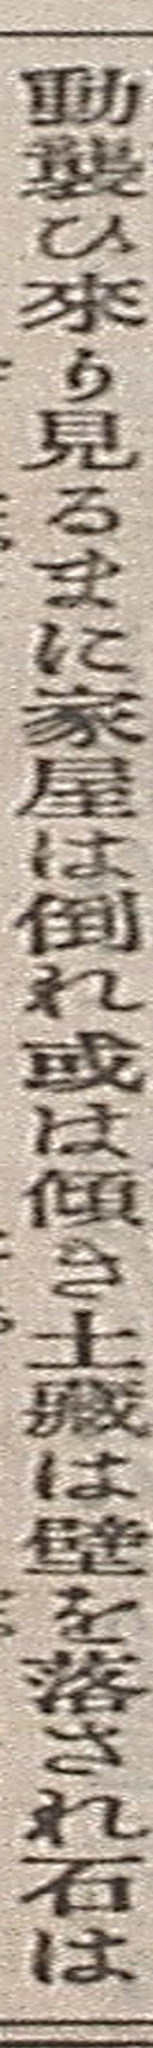動襲ひ来り見るまに家屋は倒れ或は傾き土蔵は壁を落され石は
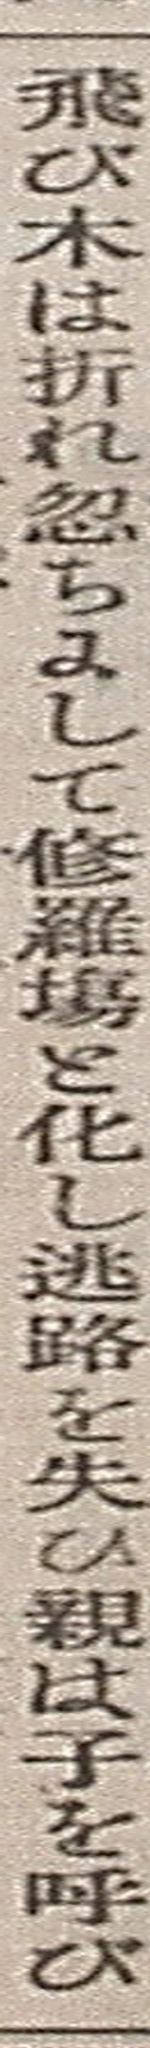飛び木は折れ忽ちにして修羅場と化し逃路を失ひ親は子を呼び
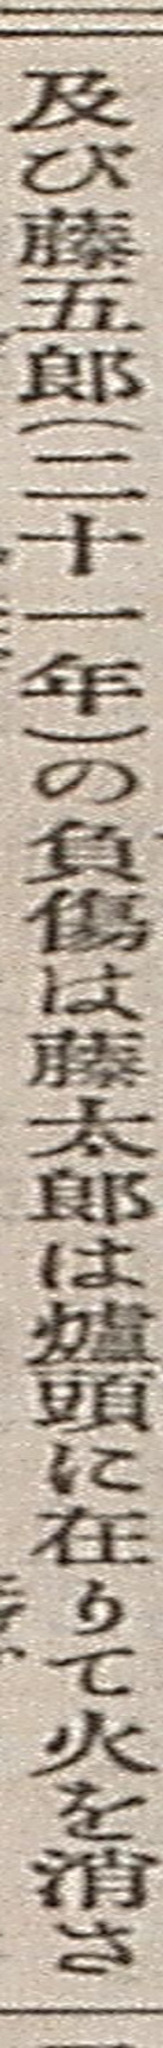及び藤五郎の負傷は藤太郎は炉頭に在りて火を消さ
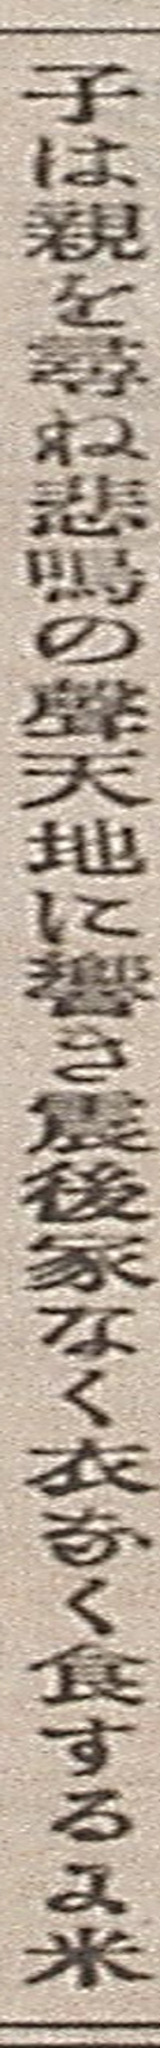子は親を尋ね悲鳴の声天地に響き震後家なく衣なく食するに米
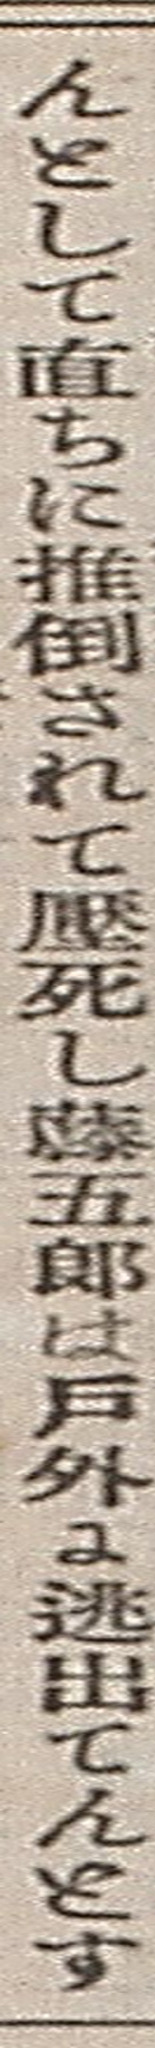んとして直ちに推倒され圧死し藤五郎は戸外に逃出てんとす
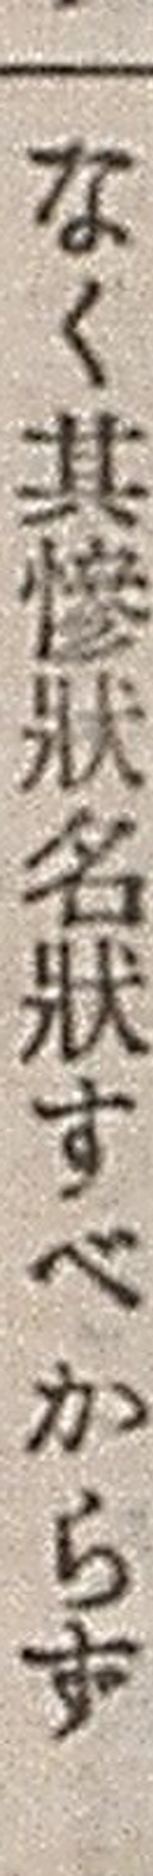なく其惨状名状すべからず
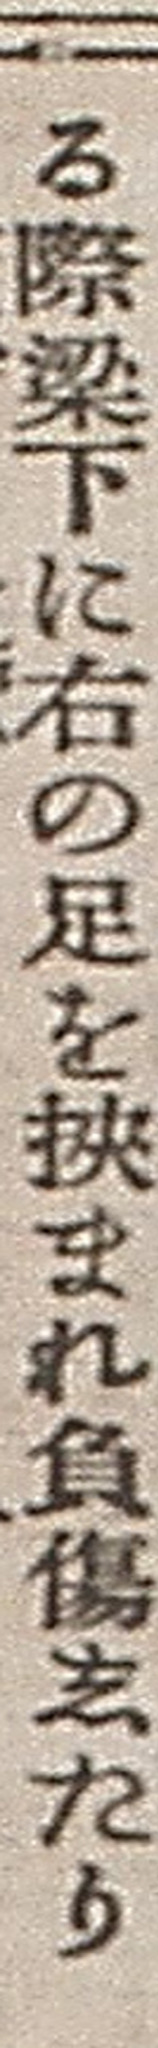る際梁下に右の足を挟まれ負傷したり
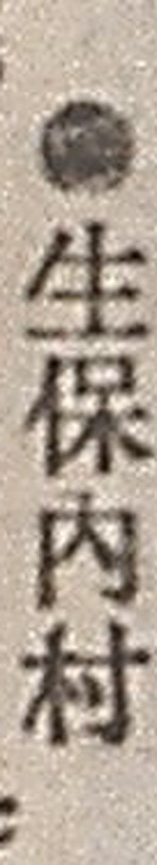●生保内村
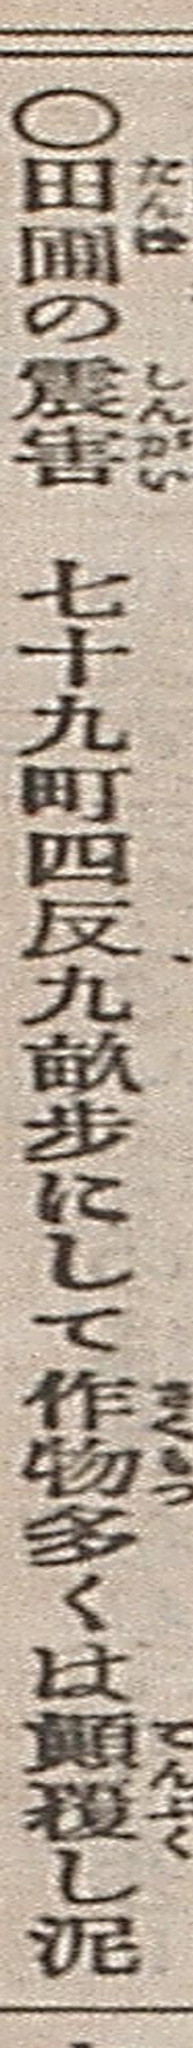〇田圃の震害七十九町四反九畝歩にして作物多くは顚覆し泥
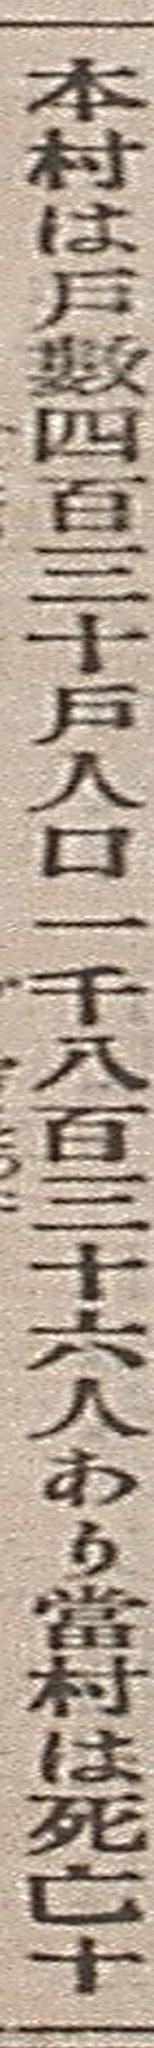本村は戸数四百三十戸人口一千八百三十六人あり当村は死亡十
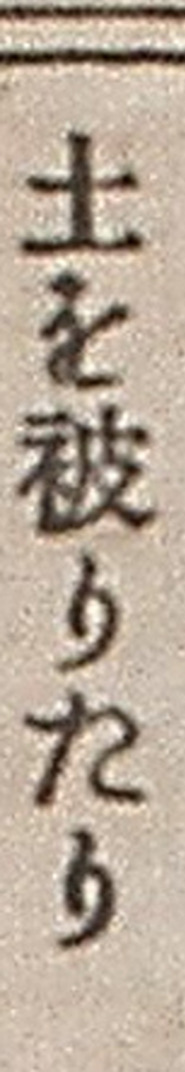土を被りたり
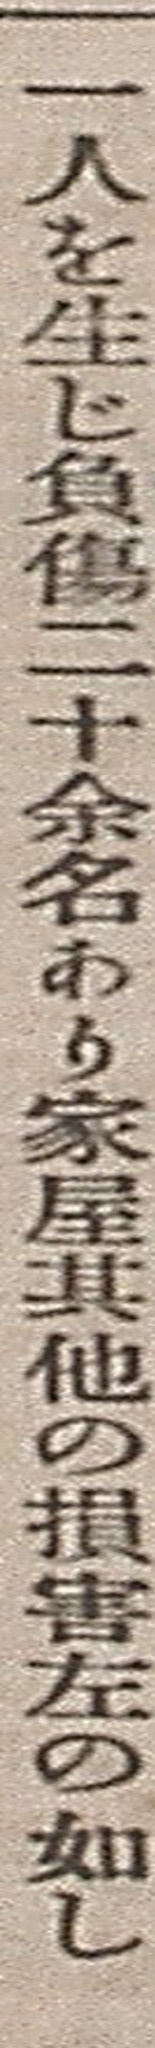一人を生じ負傷二十余名あり家屋其他の損害左の如し
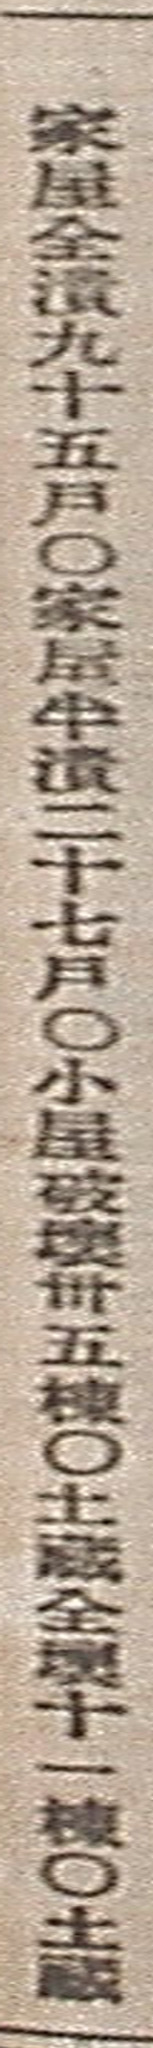家屋全潰九十五戸〇家屋半潰二十七戸〇小屋破壊卅五棟〇土蔵全壊十一棟〇土蔵
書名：風俗畫報臨時増刊第百二十四號　洪水地震被害録（上）
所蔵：東京大学地震研究所図書室 Earthquake Research Institute Library, The University of Tokyo, JAPAN
